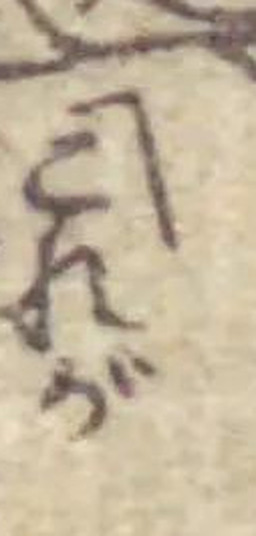〽これが
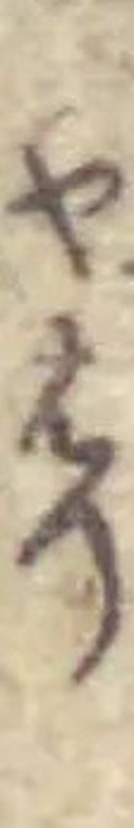やはり
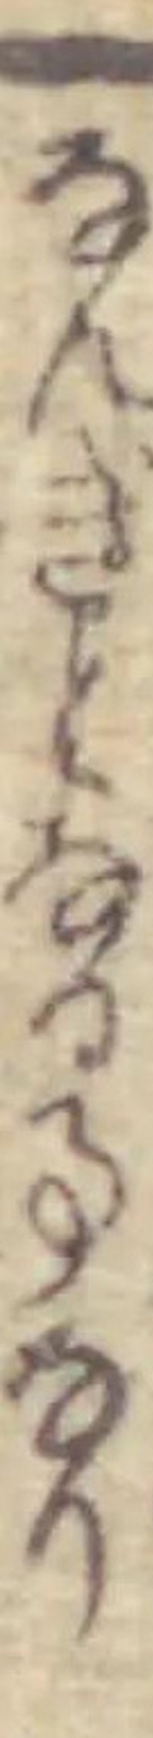なんぎとなる事なり
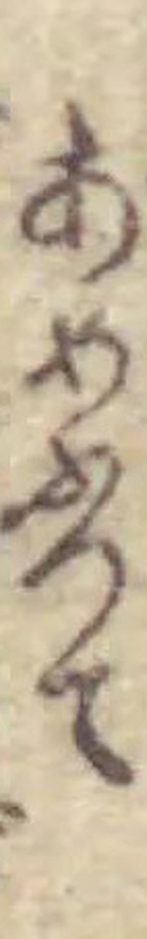あめふつて
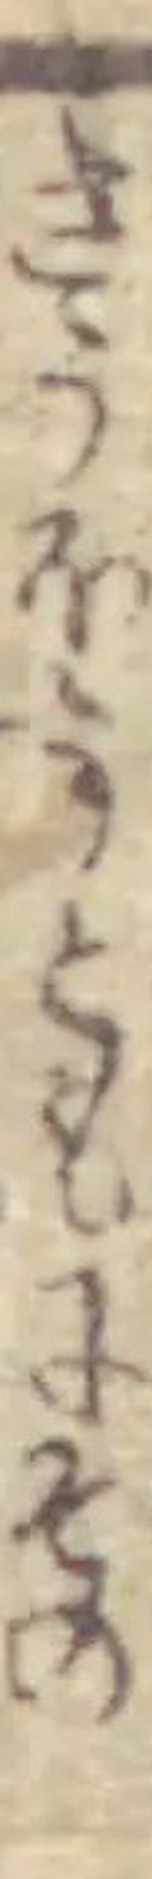さうほうともにその
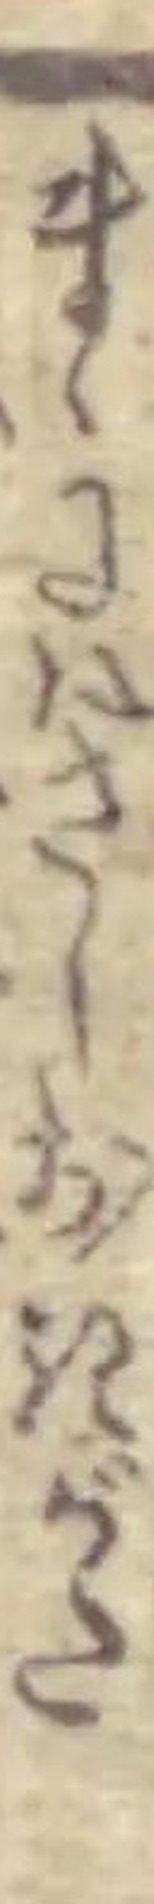まゝにはさしおきがた
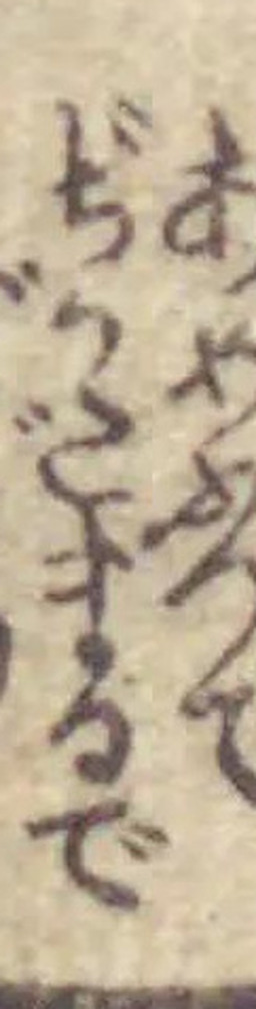ぢかたまるで
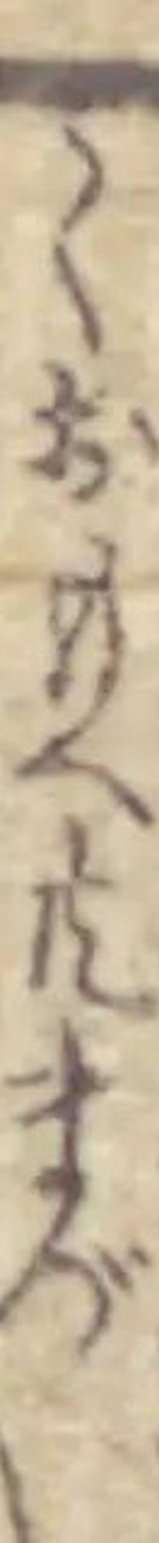くおもへ共まづ
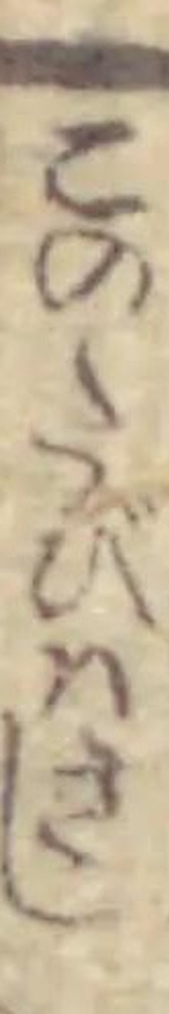このたびはさし
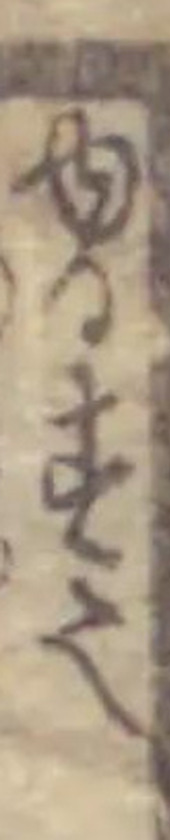ゆるす也
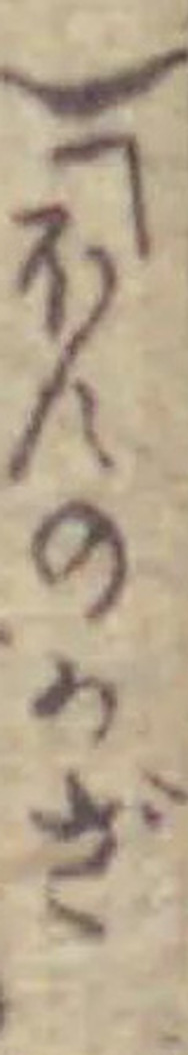〽ほんのかざ
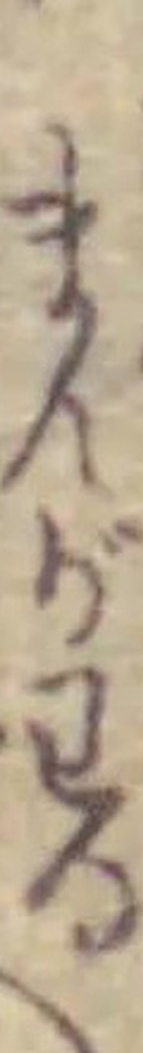まんがわる
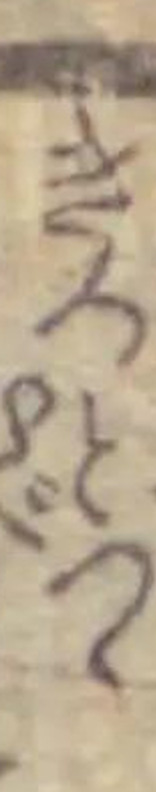きつとつゝ
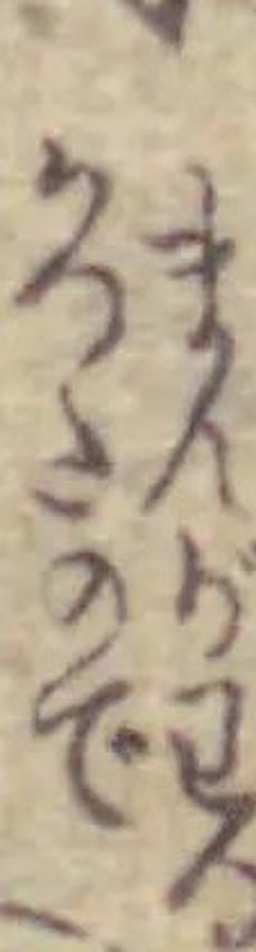かつたので
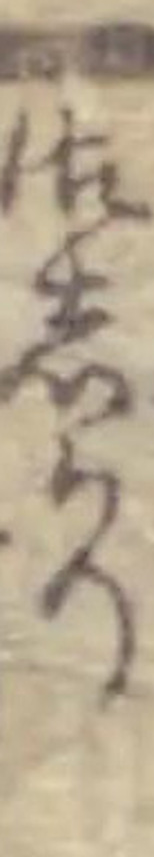御しかり
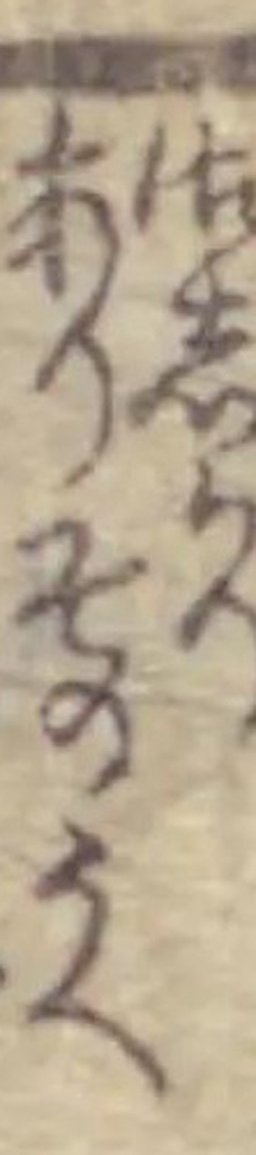ありそのうへ
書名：雨宮風宮出儘略縁記 3巻
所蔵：国立国会図書館 National Diet Library, JAPAN
